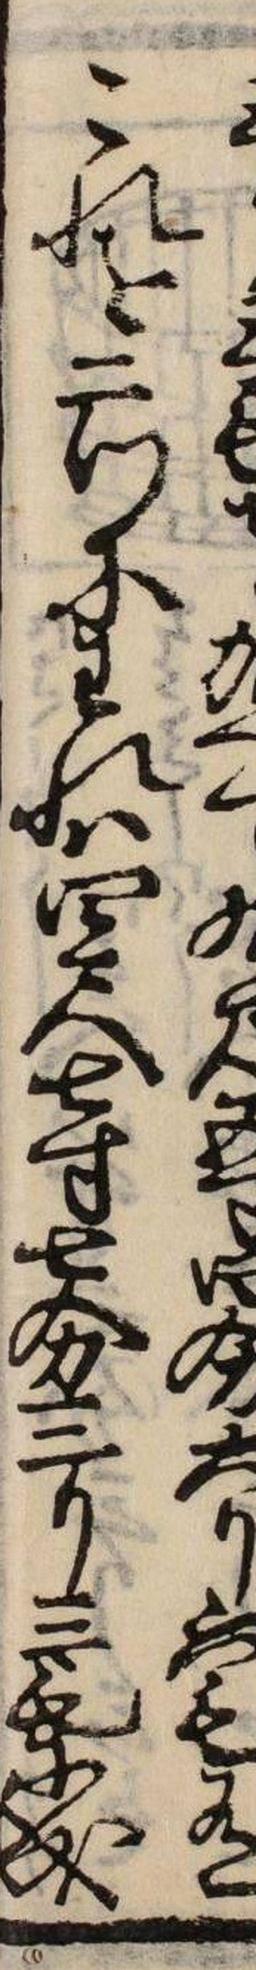これを二つにわれは四尺七寸七分三り三毛に成
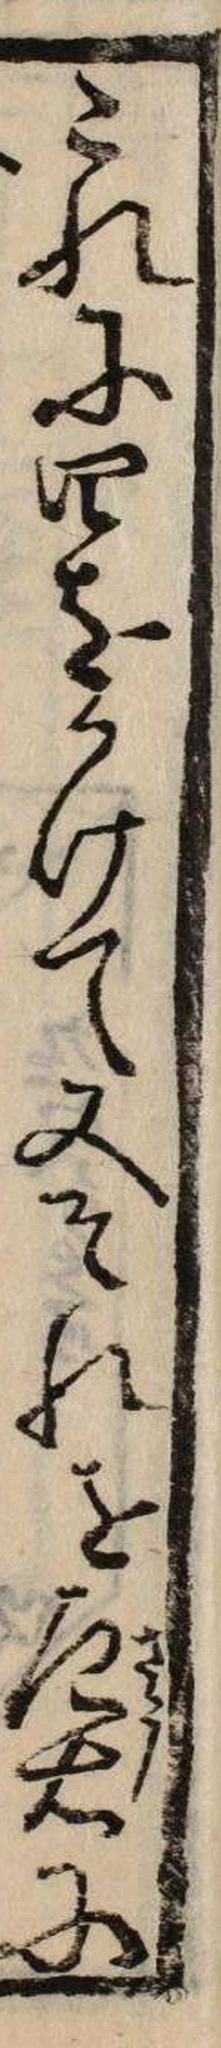これに四をかけて又それを左右に
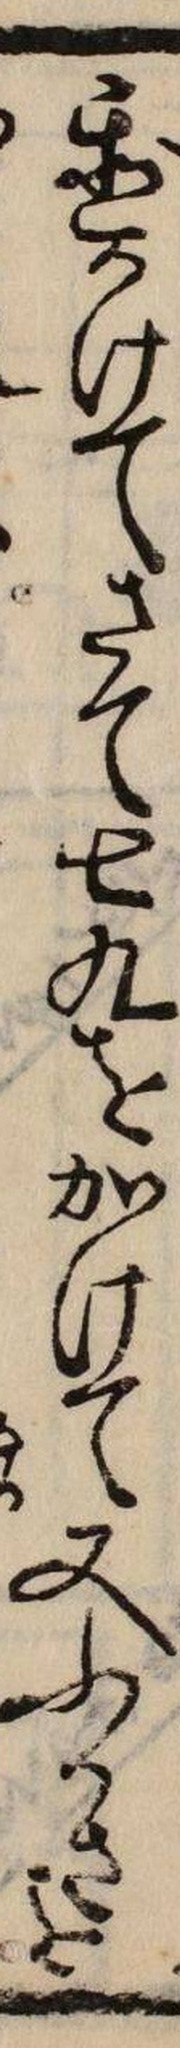置かけてさて七九をかけて又ふかさを
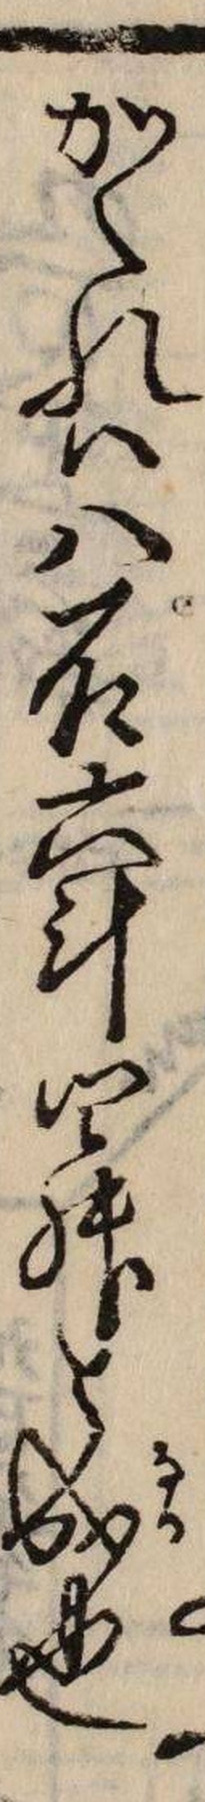かくれは八石六斗四升と成也
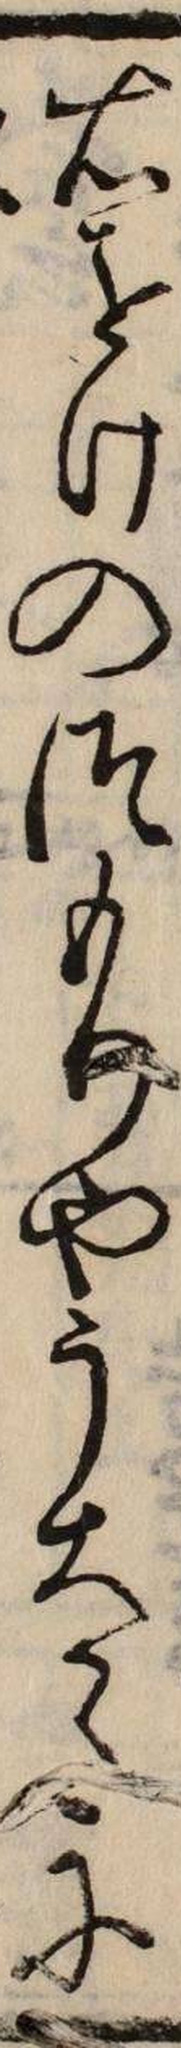右をけのつもりやう大かたに
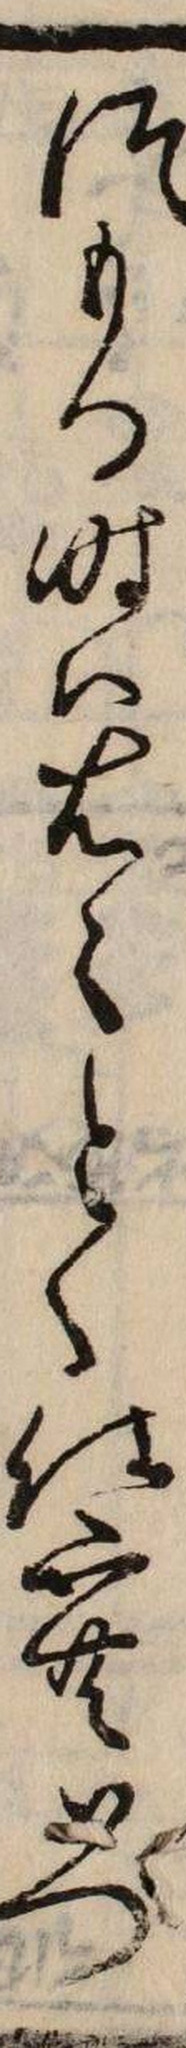つもる時は右之ことく共いつ
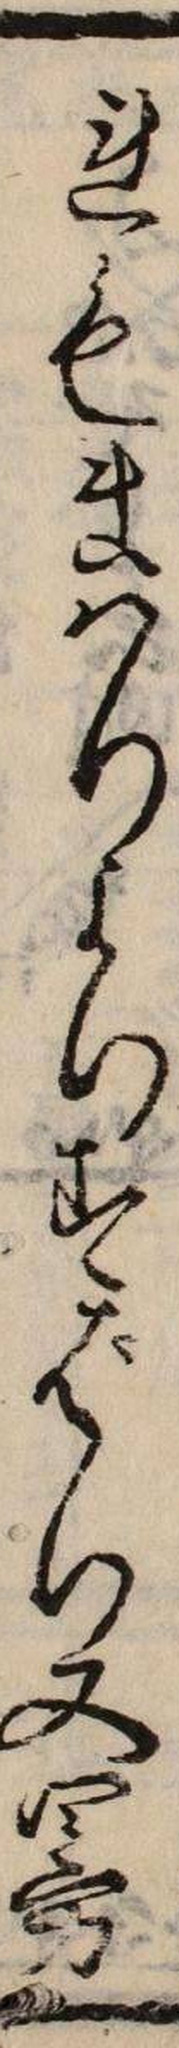けもまはりよりすばり又四方
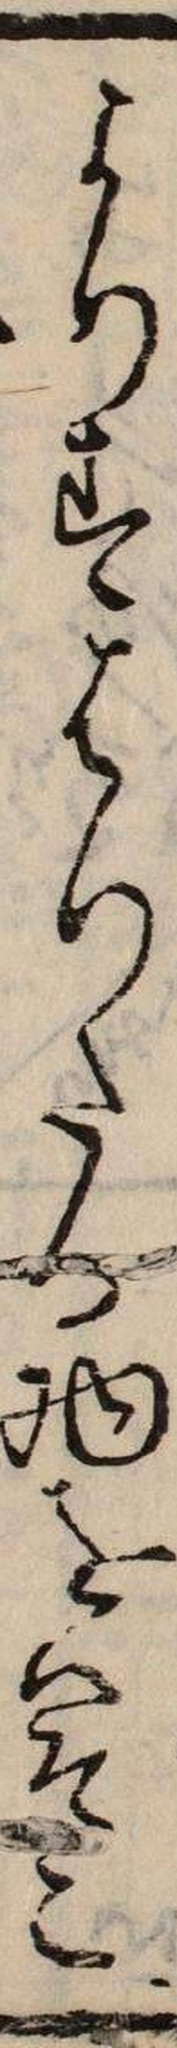よりすはりたる物をはそこ
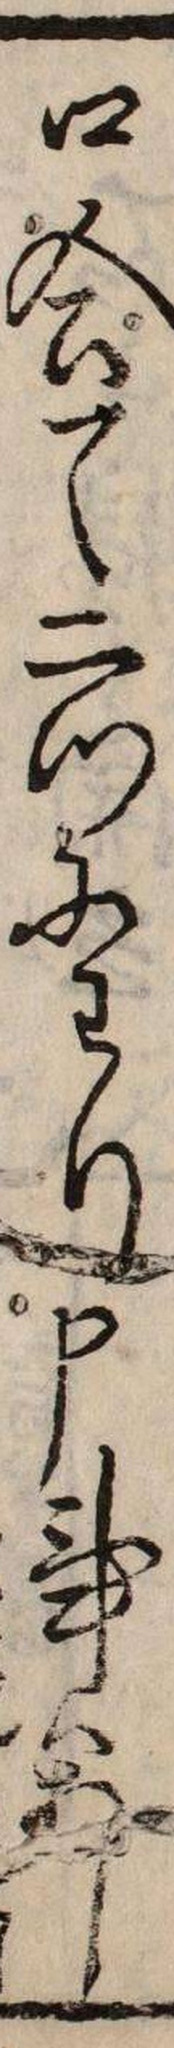口合て二つにわり申事はあし
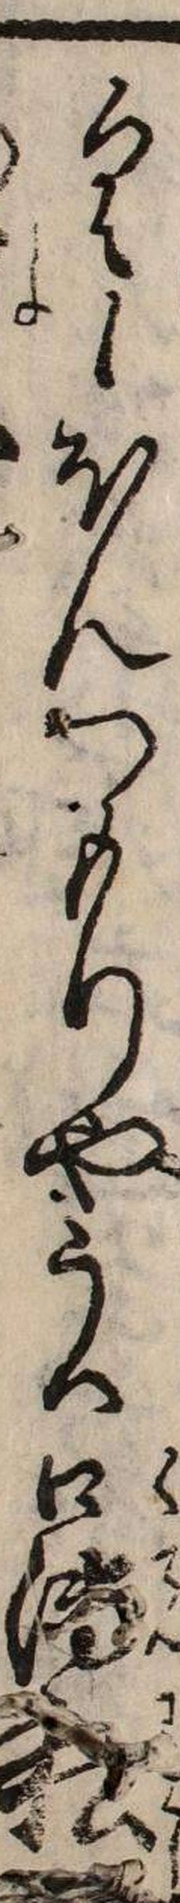くはしほんつもりやうは口伝私

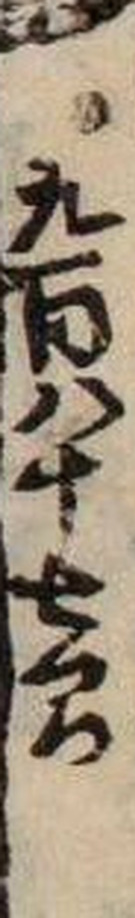九百八十七間四方
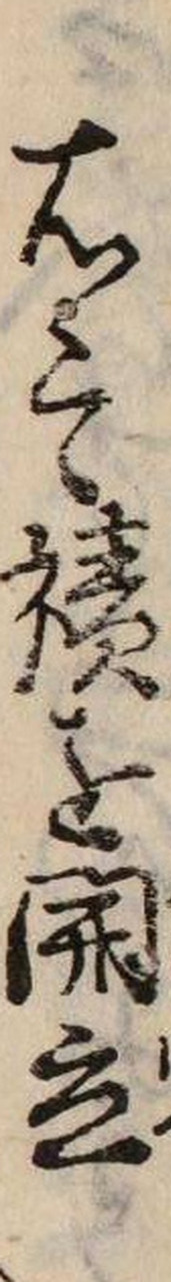右之積を開立
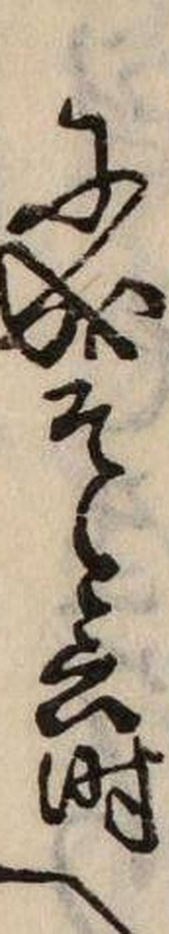に成そと云時
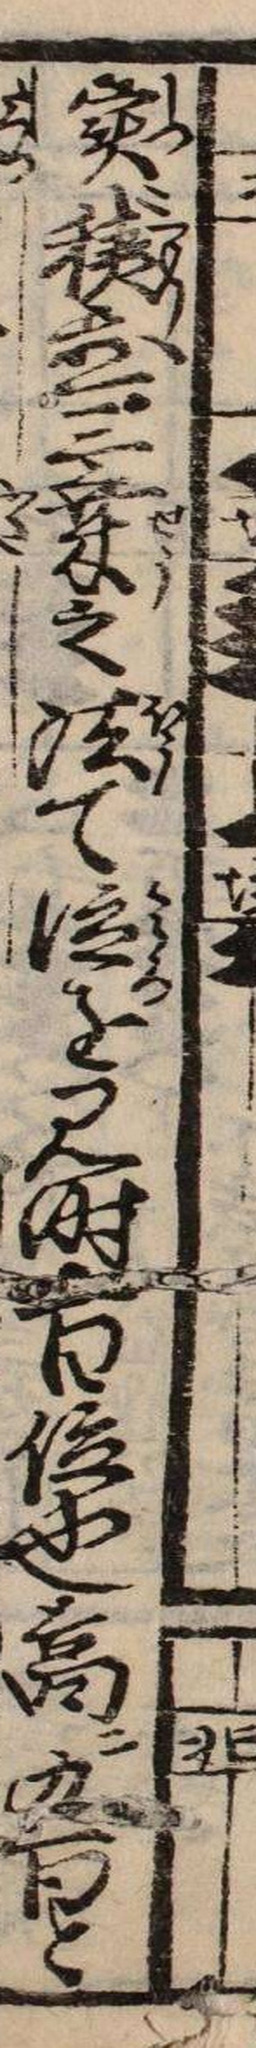実に積置三乗之法て位を見時百位也商に九百と
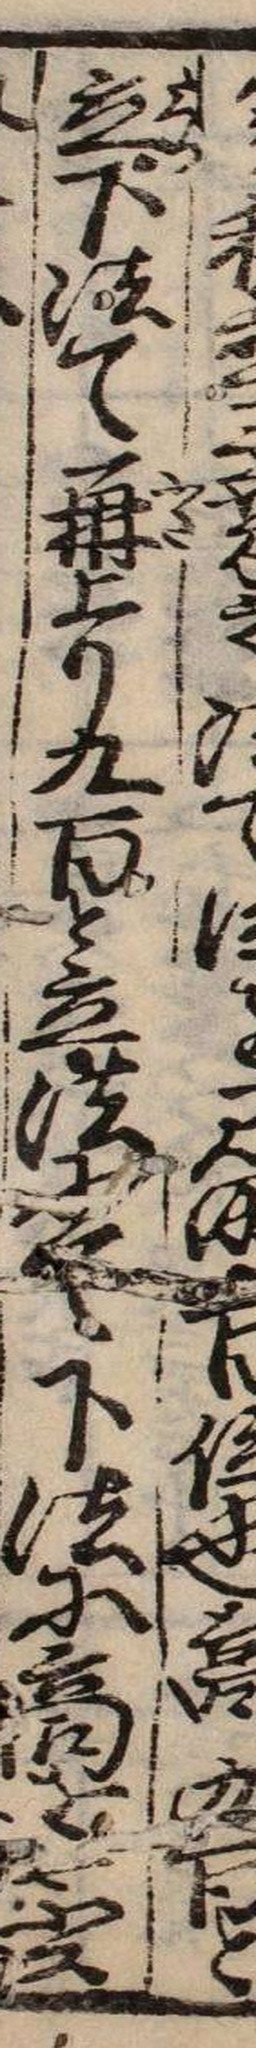立下法て再上り九百と立法にて下法に商を乗す
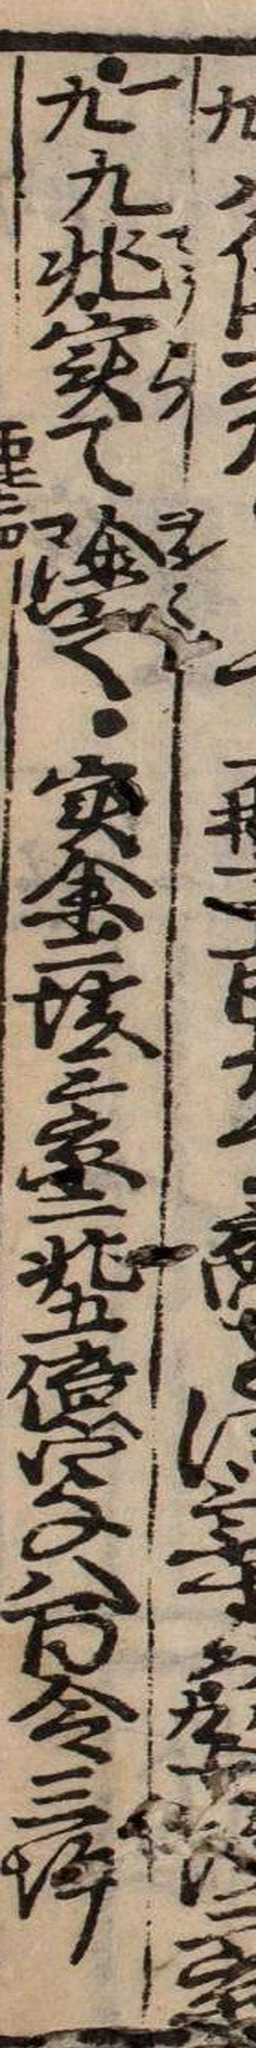一九九兆実て除之実余二垓三京二兆五億四千八百令三坪
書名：塵劫記（寛永11年自跋、京都府立京都学・歴彩館追貴8）
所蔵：京都府立京都学・歴彩館 国文学研究資料館
